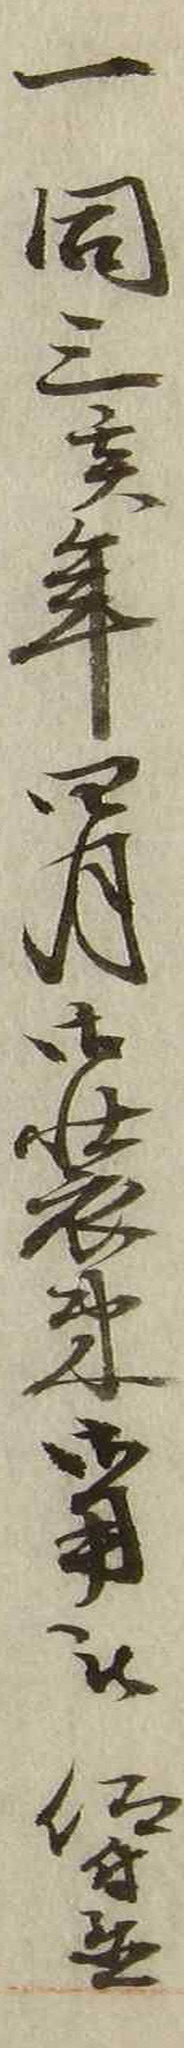一同三亥年四月御装束御用被仰付置
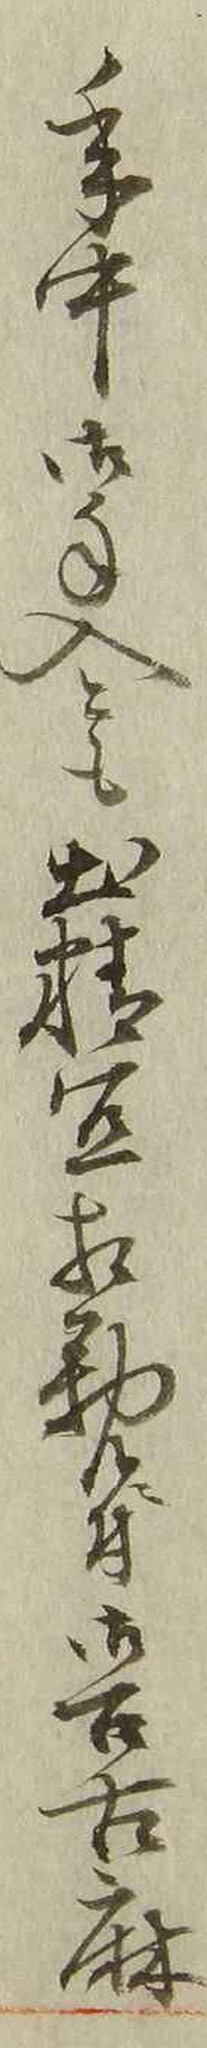年中御手入とも出精宜相勤候ニ付御召古麻
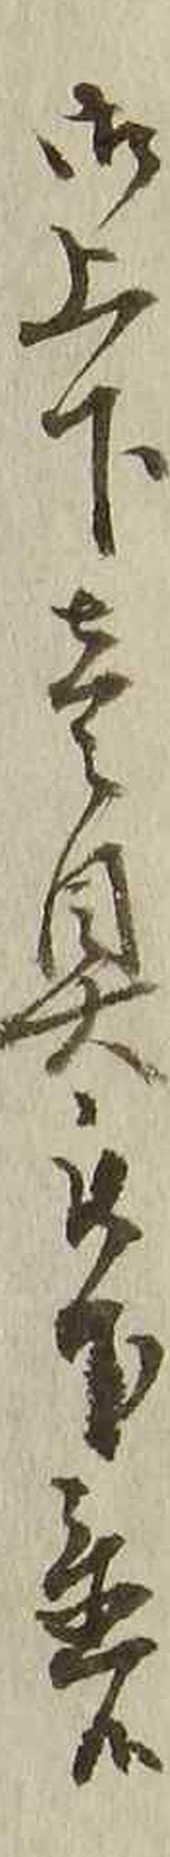御上下壱具被下置候
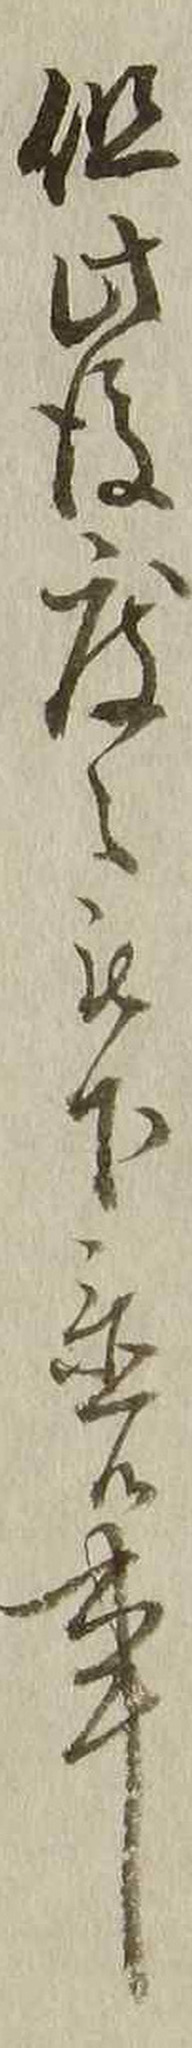但此後度々被下置候事
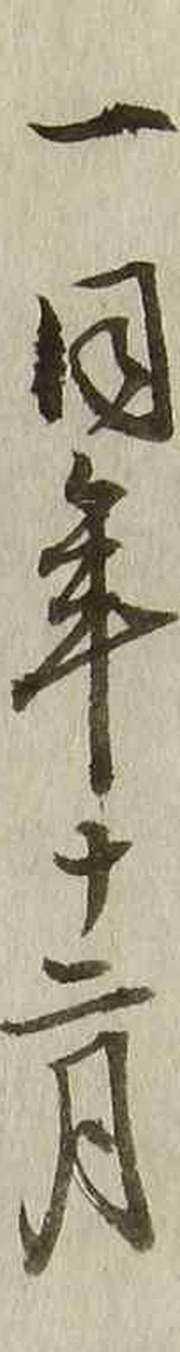一同年十二月
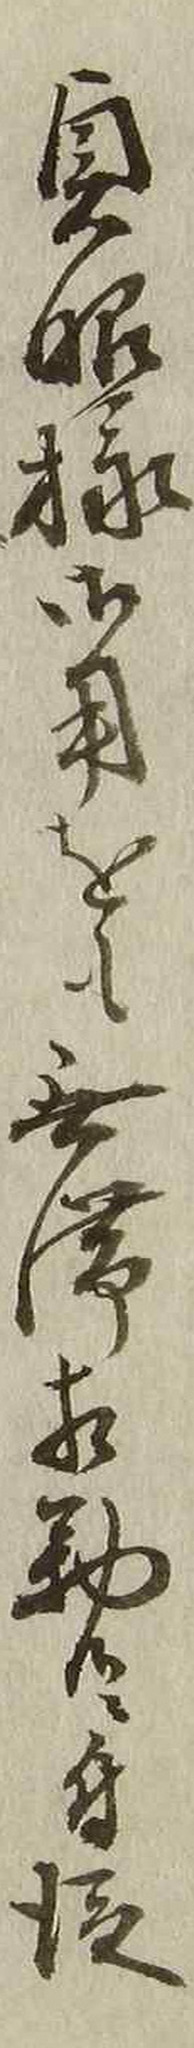貞昭様御用をも無滞相勤候ニ付従
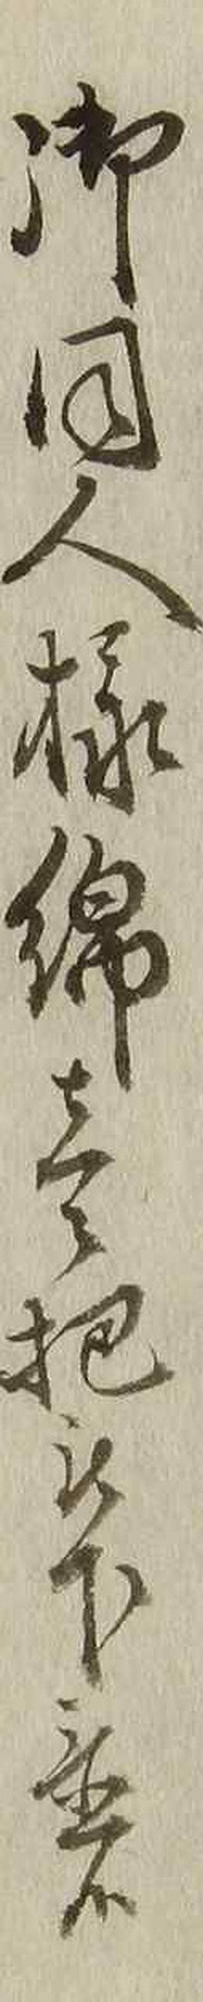御同人様綿壱把被下置候
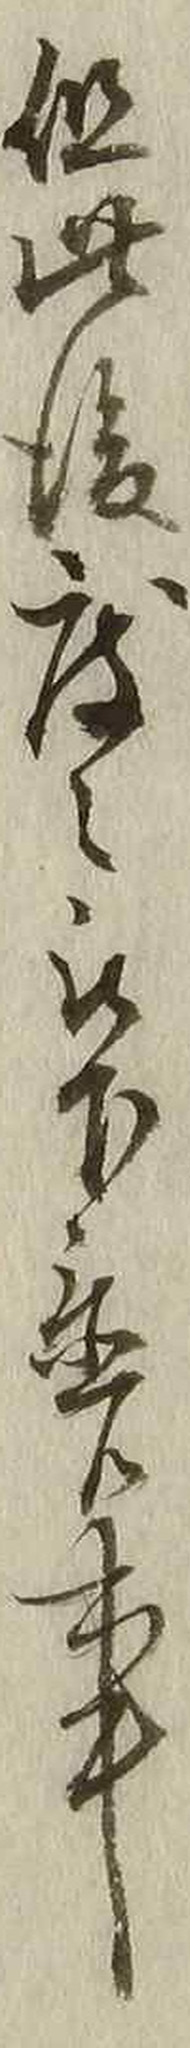但此後度々被下置候事
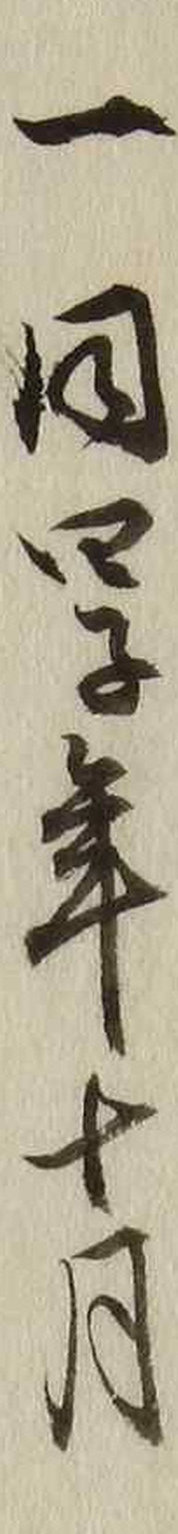一同四子年十月
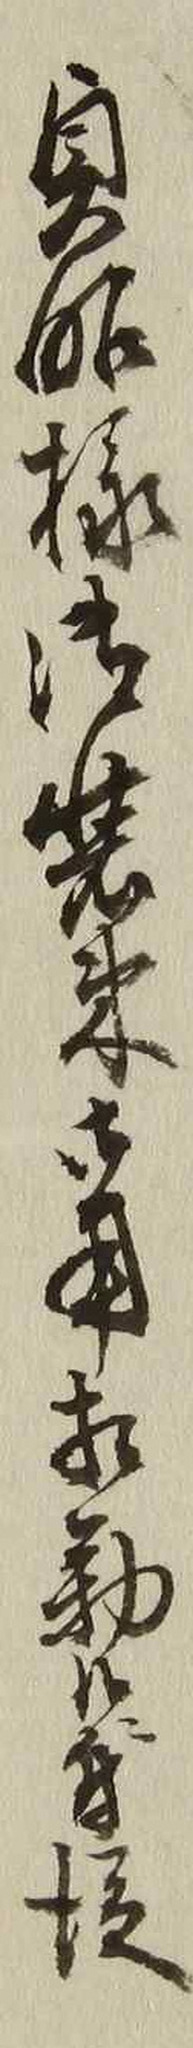貞昭様御装束御用相勤候ニ付従
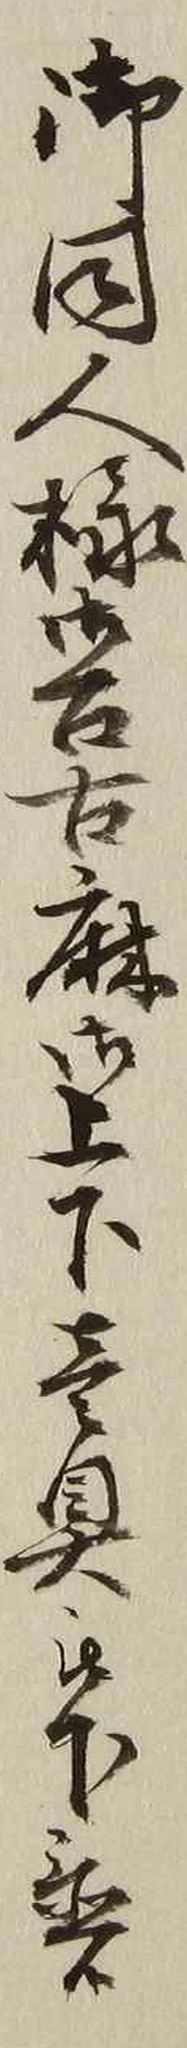御同人様御召古麻御上下壱具被下置候
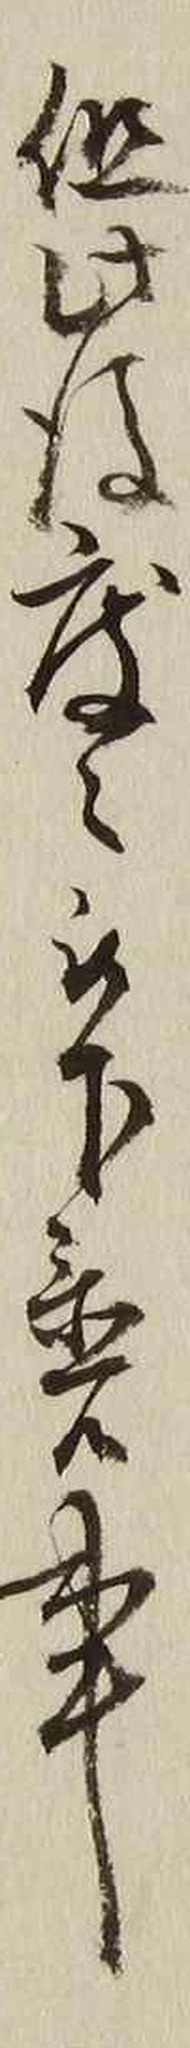但此後度々被下置候事
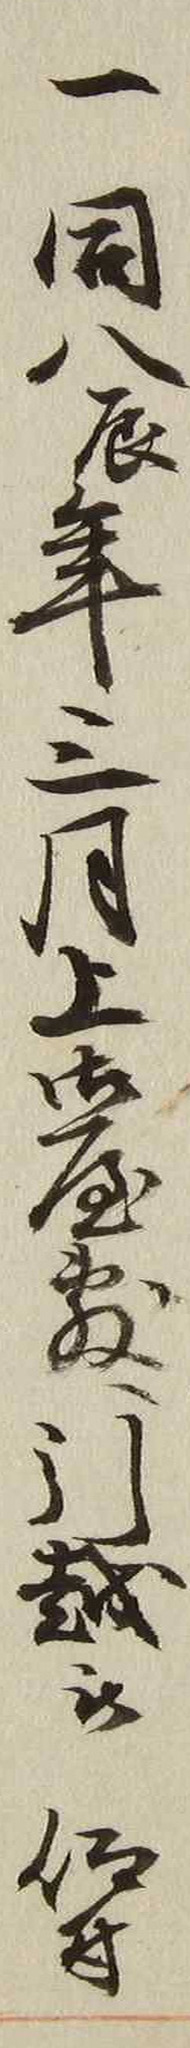一同八辰年三月上御屋敷へ引越被仰付
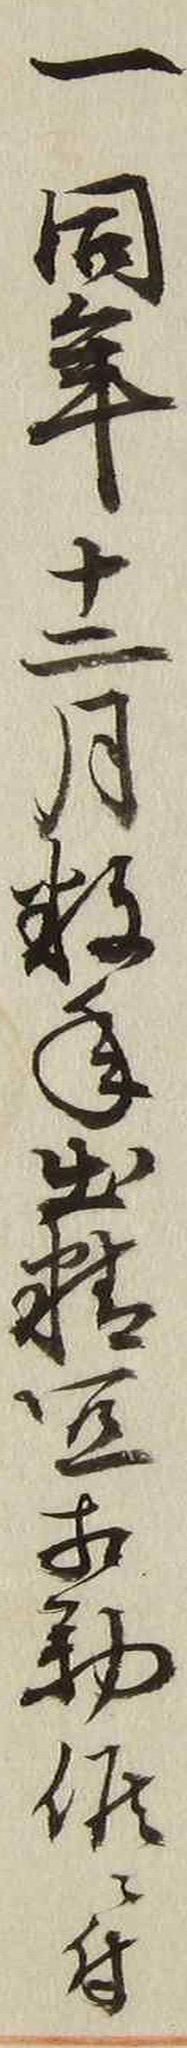一同年十二月数年出精宜相勤候ニ付
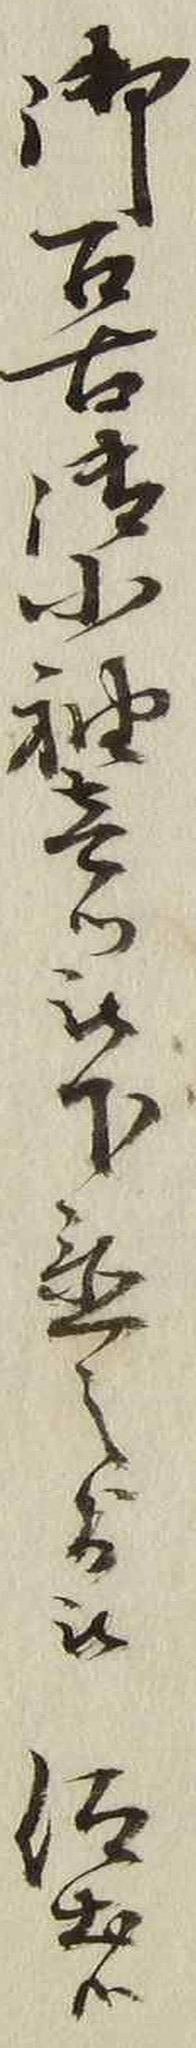御召古御小袖壱ツ被下置之旨被仰出候
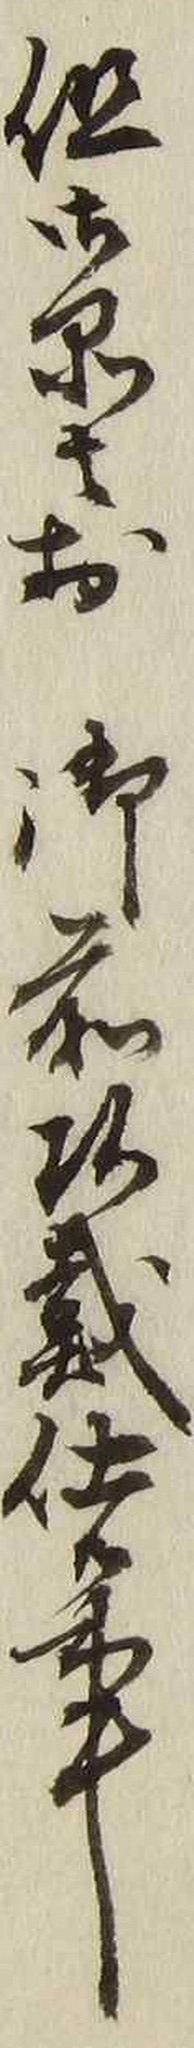但御品者於御前頂戴仕候事
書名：諸士系譜　巻之23　い之部23
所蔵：会津若松市立会津図書館
